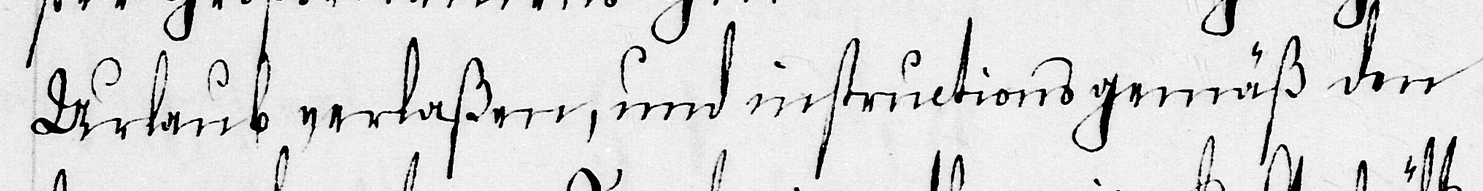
Urlaub verlaßen, und instructionsgemäß den
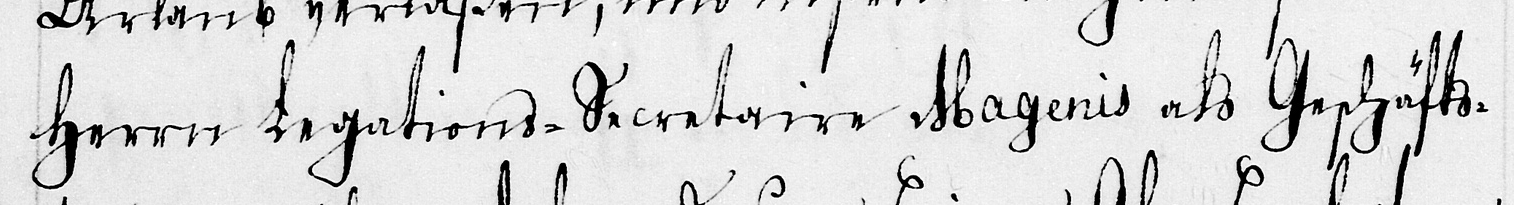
Herrn Legations-Secretaire Magenis als Geschäfts¬
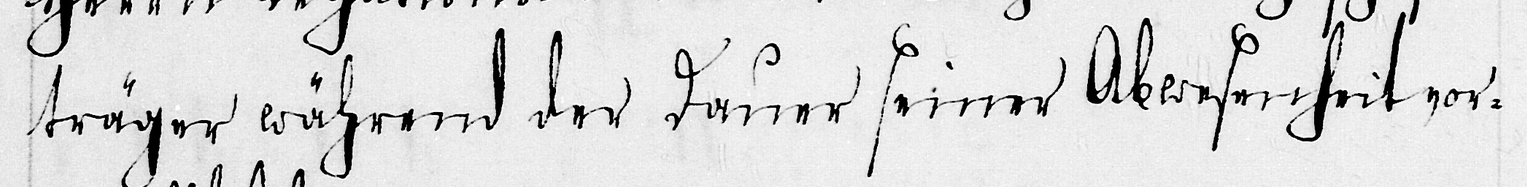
träger während der Dauer seiner Abwesenheit vor¬
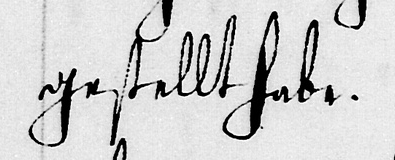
gestellt habe.
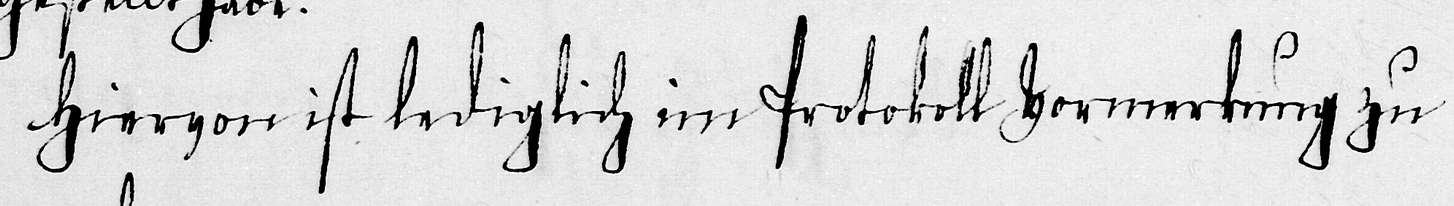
Hiervon ist lediglich im Protokoll Vormerkung zu
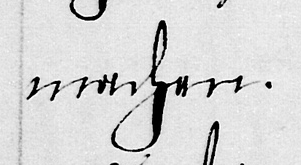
machen.
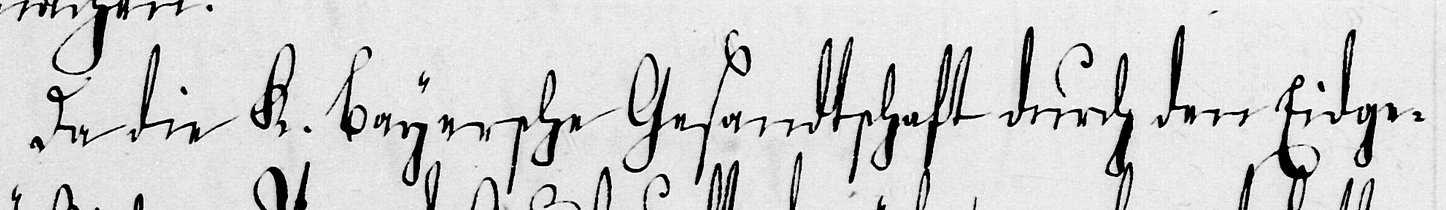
Da die K. Bayersche Gesandtschaft durch den Eidge¬
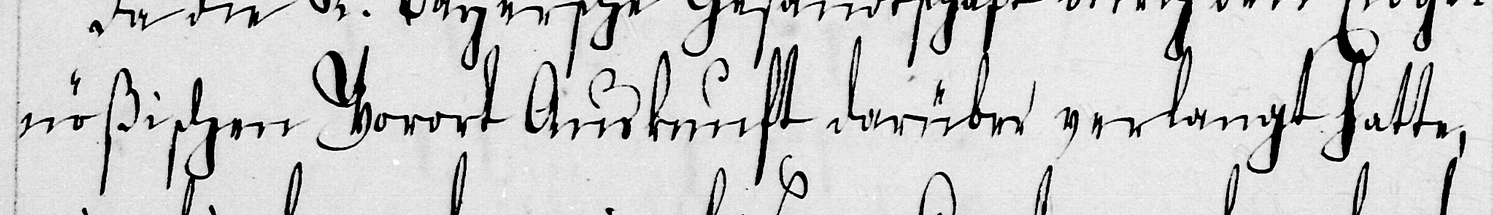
nößischen Vorort Auskunft darüber verlangt hatte,
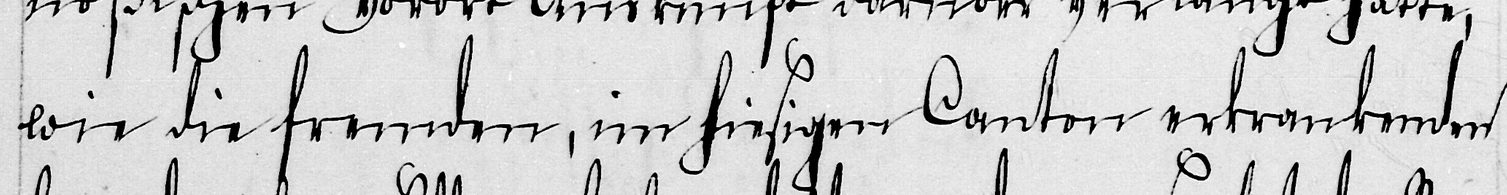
wie die fremden, im hiesigen Canton erkrankenden
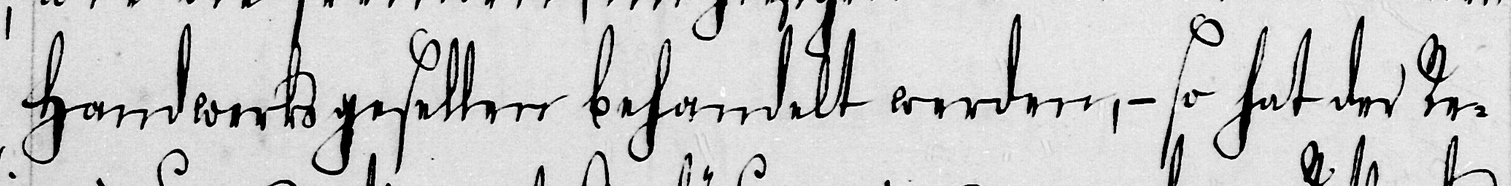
Handwerksgesellen behandelt werden, – so hat der R¬
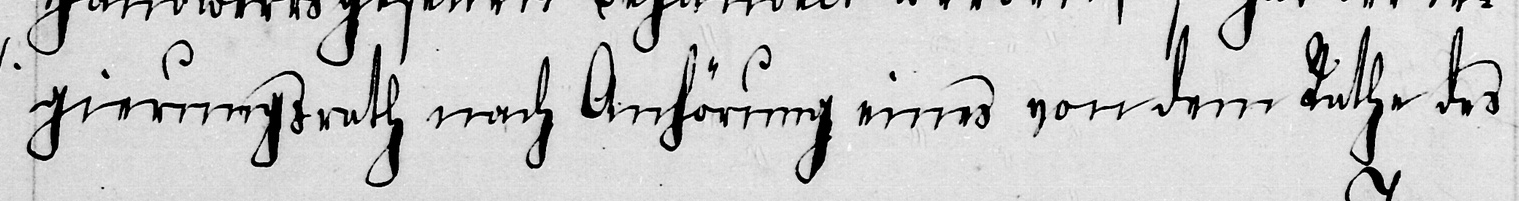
egierungsrath nach Anhörung eines von dem Rathe des
